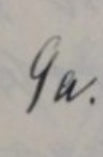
9a.
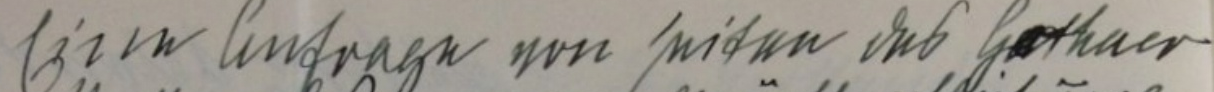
Ein Antrag von Seiten des Gothaer
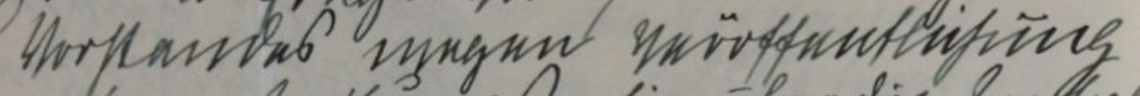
Vorstandes wegen Veroffentlichung
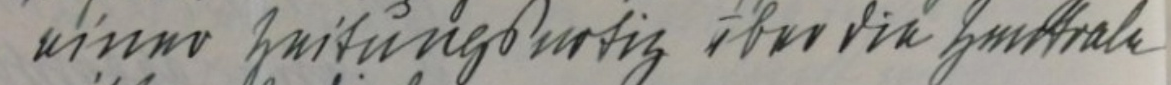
einer Zeitungsnotiz über die Zentrale
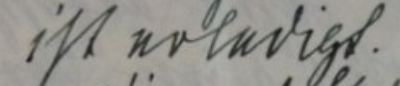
ist erledigt.
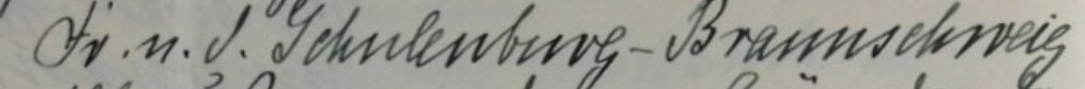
Fr. v. d. Schulenburg - Braunschweig
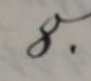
8.
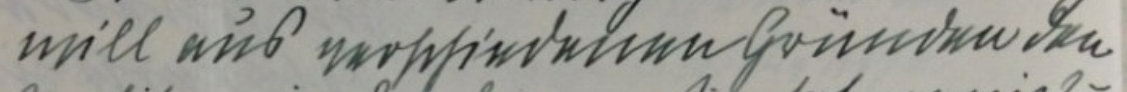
willl aus verschiedenen Gründen den
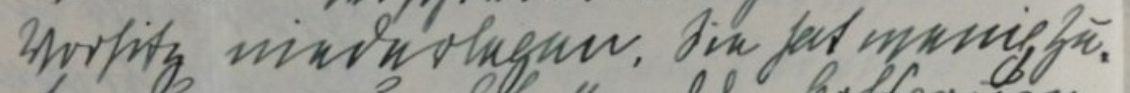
Vorsitz niederlegen. Sie hat wenig Zu
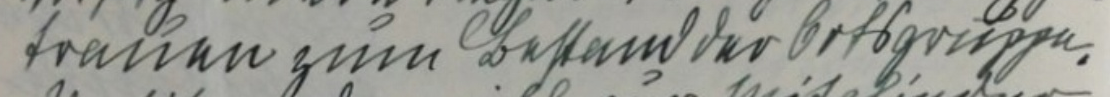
trauen zum Bestand der Ortsgruppe.
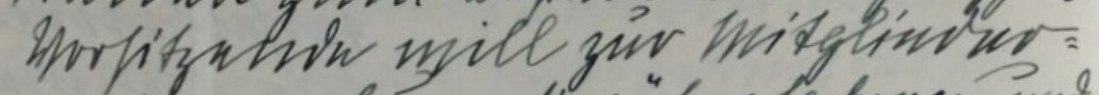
Vorsitzende will zur Mitglieder
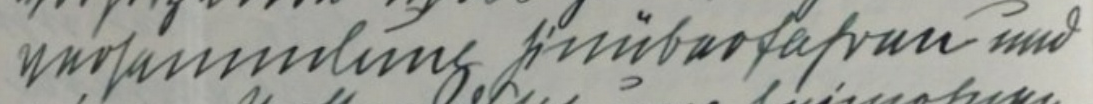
versammlung hinüberfahren und
